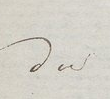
du
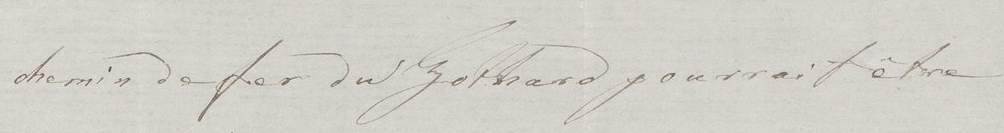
chemin de fer du Gothard pourrait être
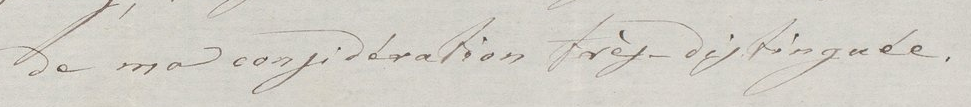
de ma considération très-distinguée.
